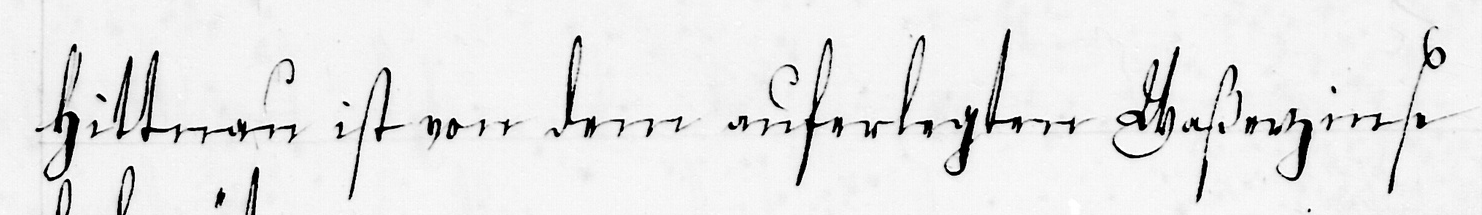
Hittnau ist von dem auferlegten Waßerzinse
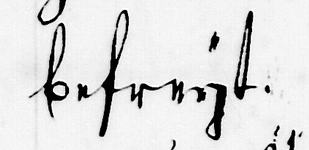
befreyt.
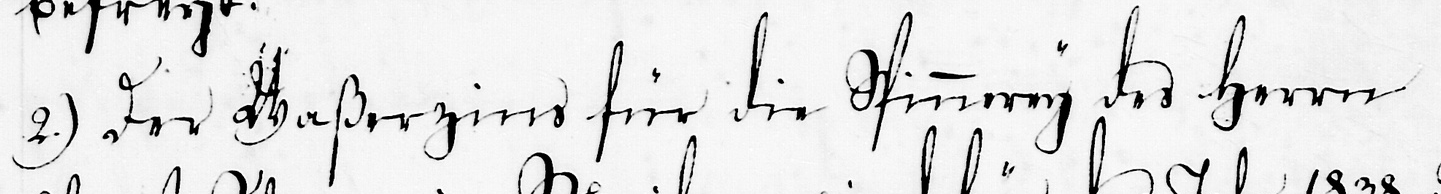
2.) Der Waßerzins für die Spinnerey des Herrn
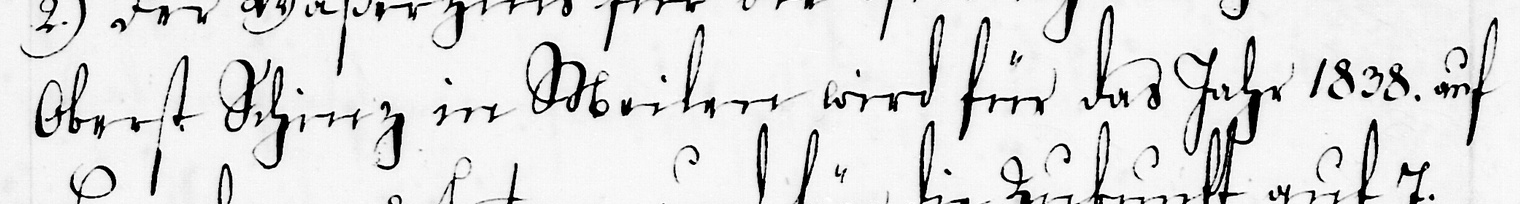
Oberst Schinz in Meilen wird für das Jahr 1838. auf
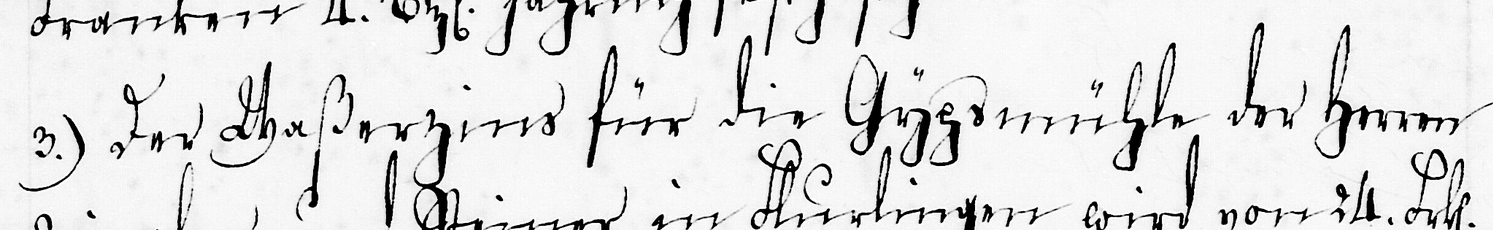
3.) Der Waßerzins für die Gypsmühle der Herren
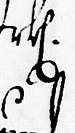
9.
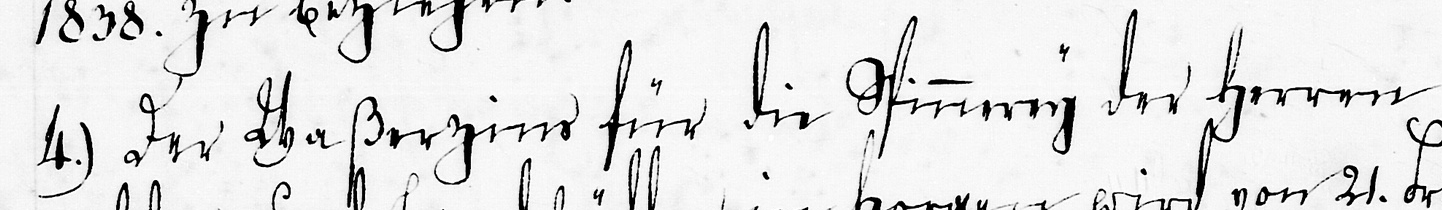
4.) Der Waßerzins für die Spinnerey der Herren
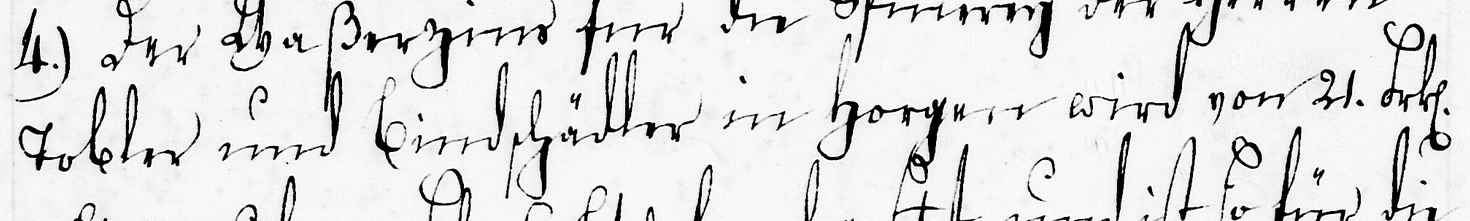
Tobler und Bindschädler in Horgen wird von 21. Fr¬
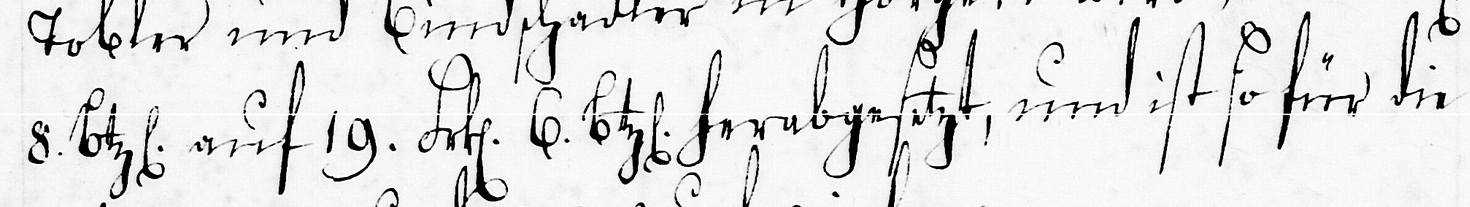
Frk[en]. 6. Btz[en]. herabgesetzt, und ist so für die
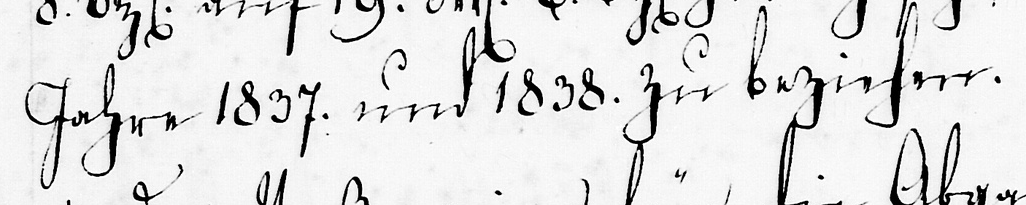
Jahre 1837. und 1838. zu beziehen.
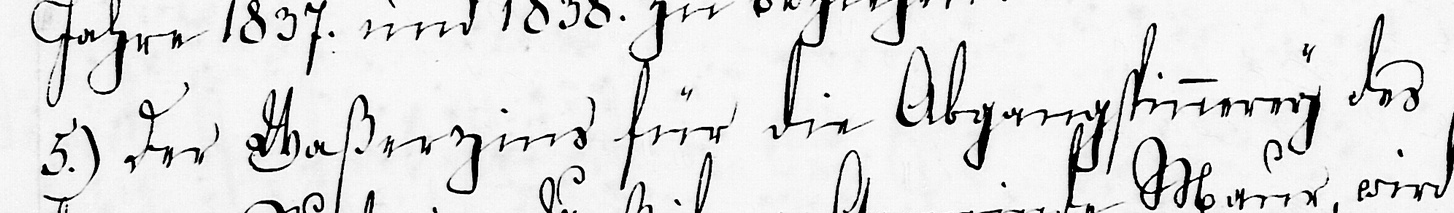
5.) Der Waßerzins für die Abgangspinnerey des
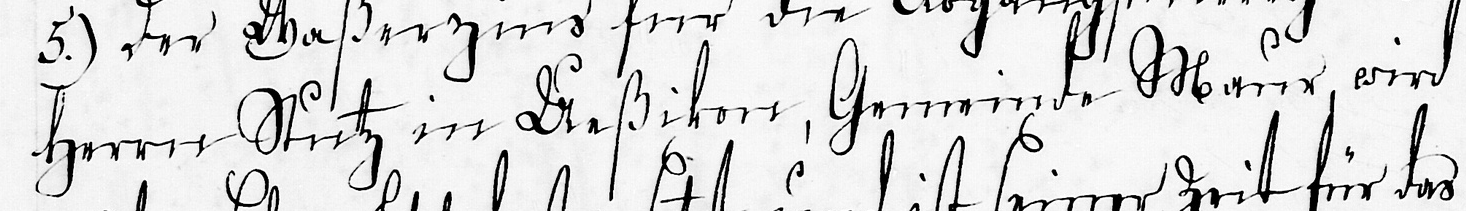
Herrn Stutz in Ueßikon, Gemeinde Maur wird
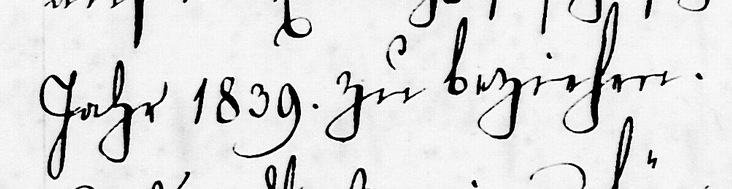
Jahr 1839. zu beziehen.
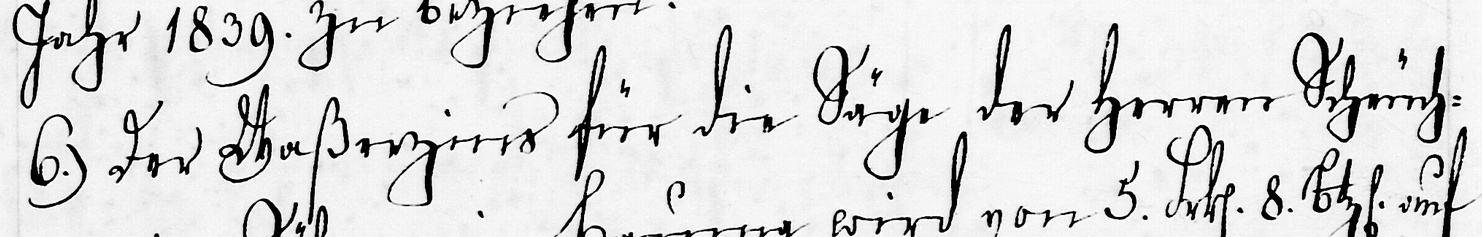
6.) Der Waßerzins für die Säge der Herren Scheuch¬
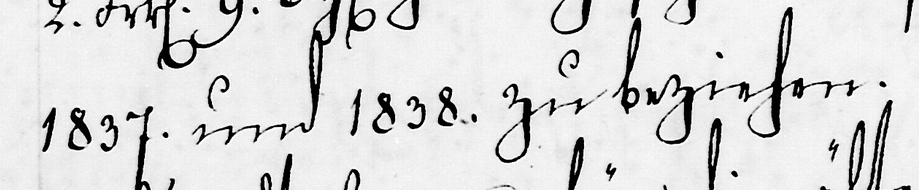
1837. und 1838. zu beziehen.
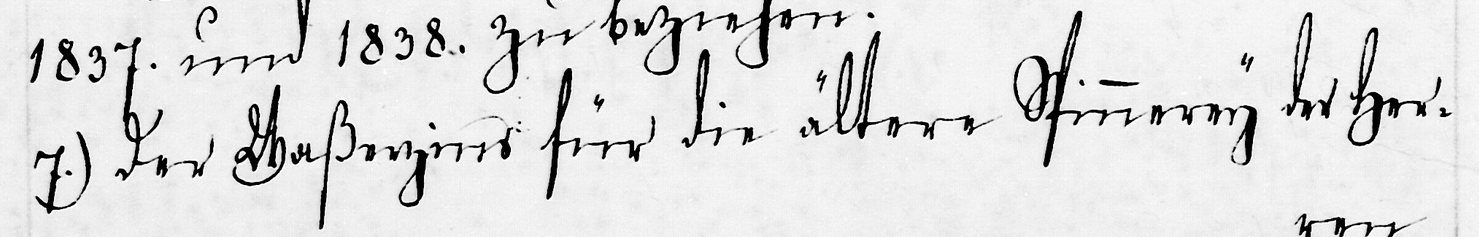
7.) Der Waßerzins für die ältere Spinnerey der Her-
